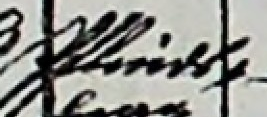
Pflinds„
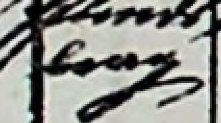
berg
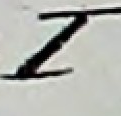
I
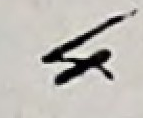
4
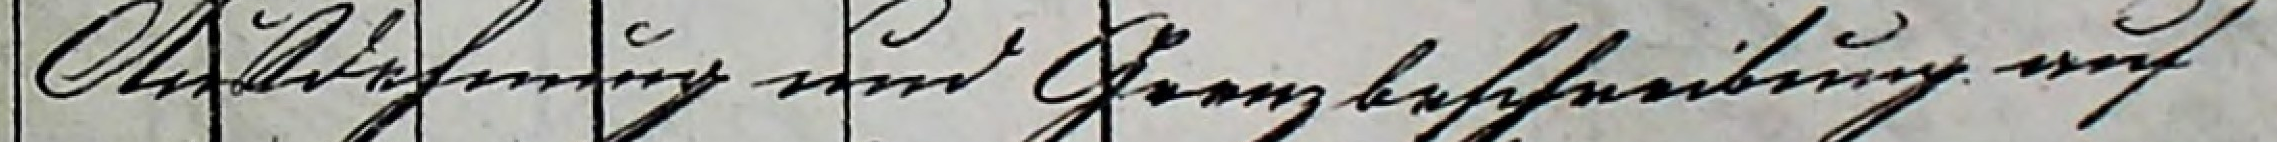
Ausdehnung und Grenz Beschreibung auf
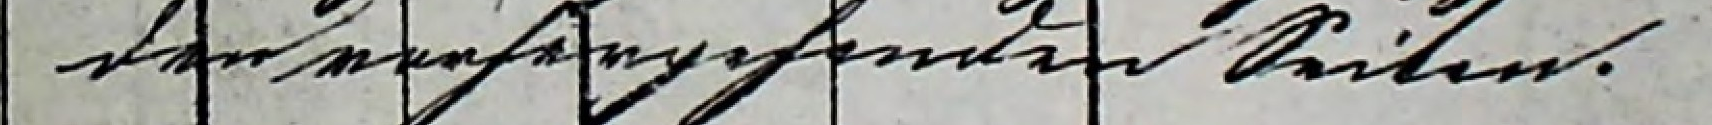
der vorhergehenden Seiten.
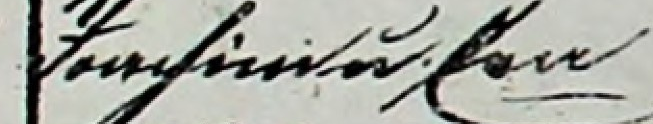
Joachim u. Eva
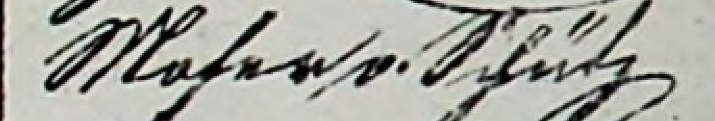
Moser v. Schütz
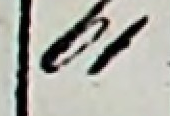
61
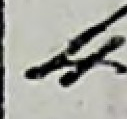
4
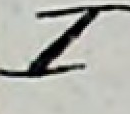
I
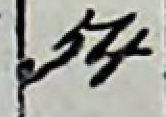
54
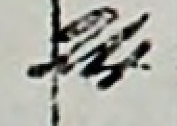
24
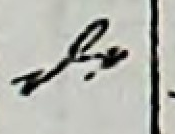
do
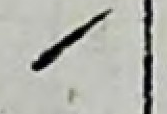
1
